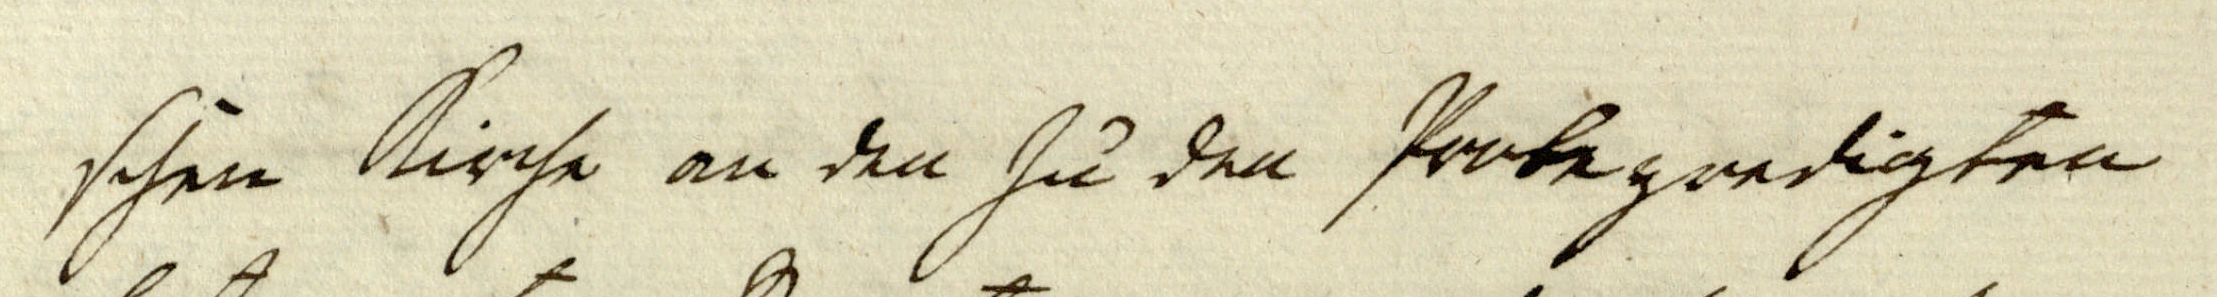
schen Kirche an den zu den Probepredigten
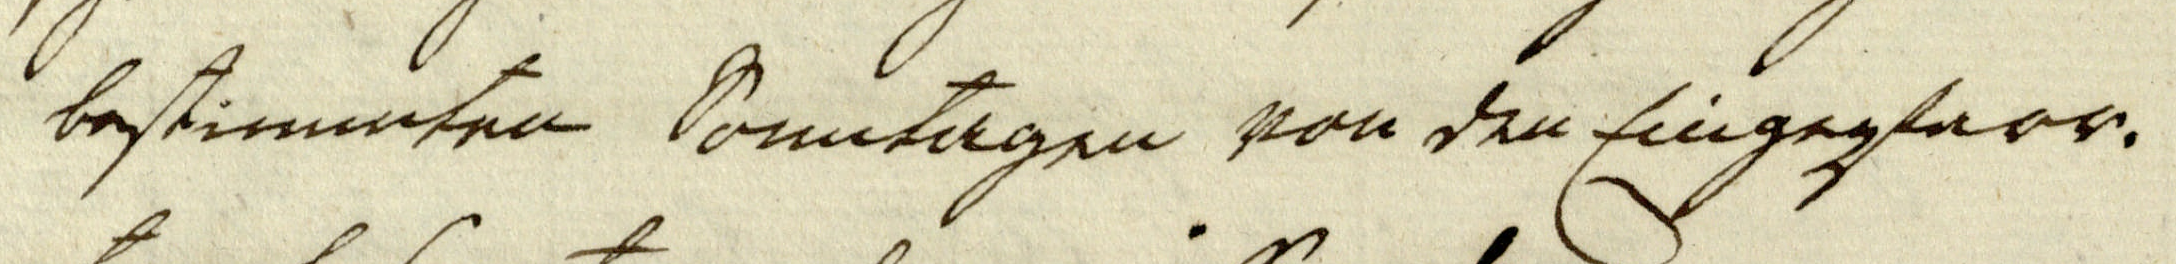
bestimmten Sonntagen von den Eingepfarr¬
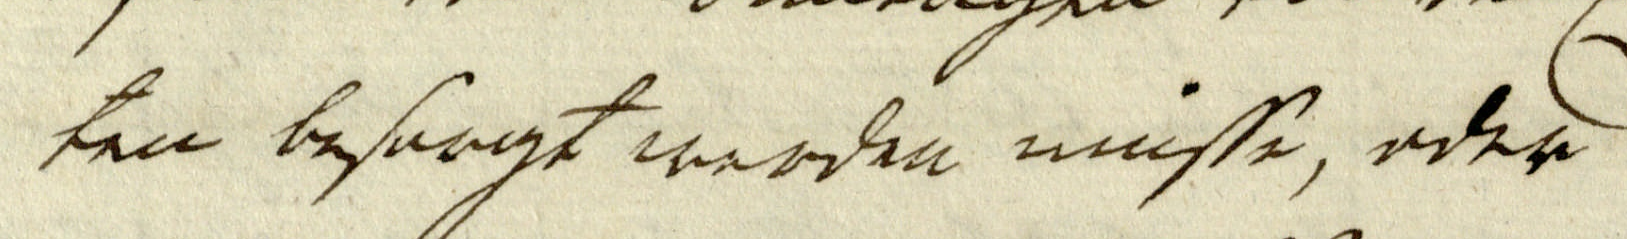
ten besorgt werden müsse, oder
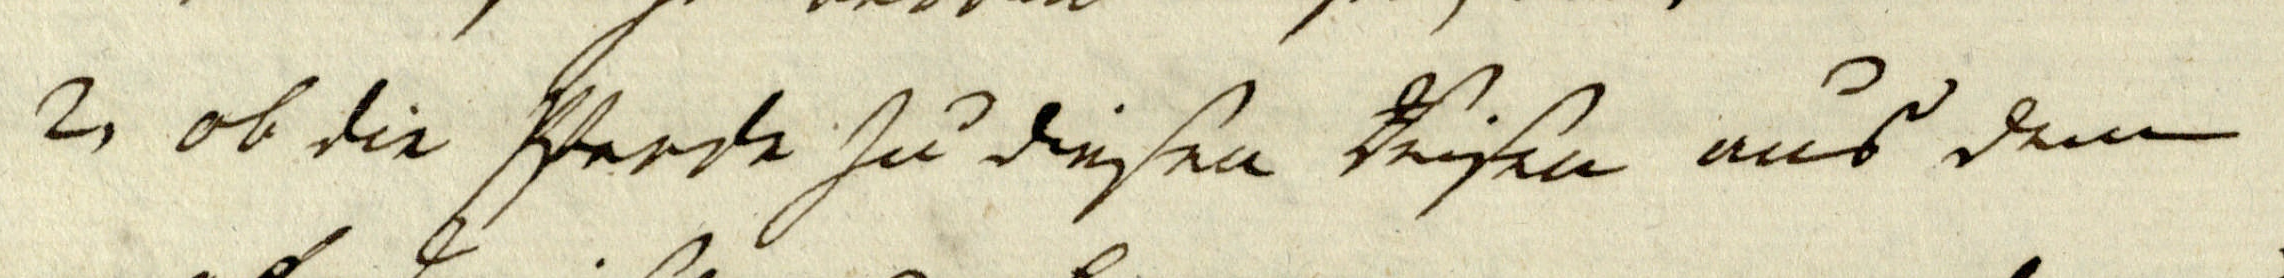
2, ob die Pferde zu diesen Reisen aus dem
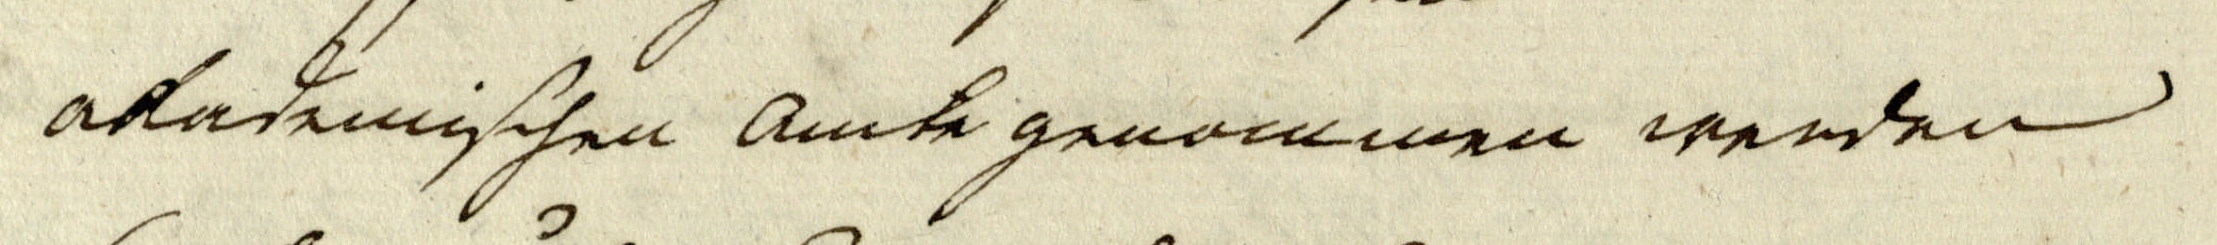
akademischen Amte genommen werden
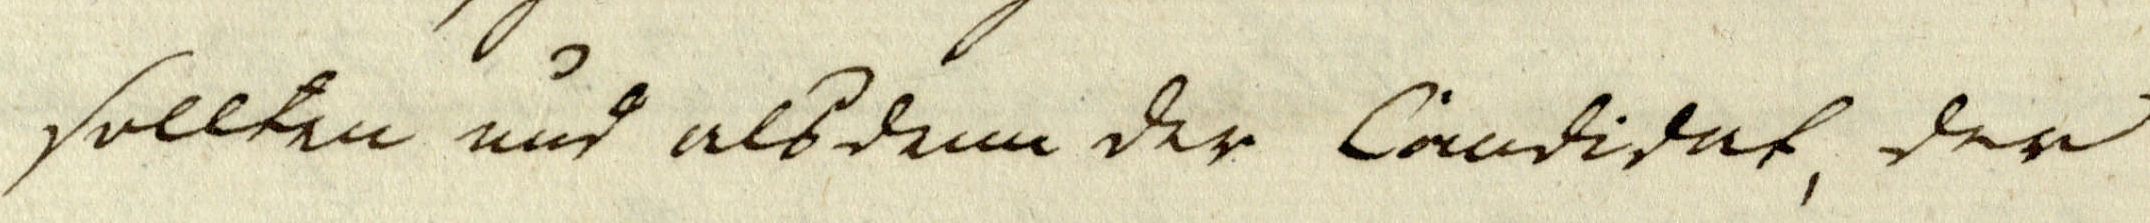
sollten und als denn der Candidat, der
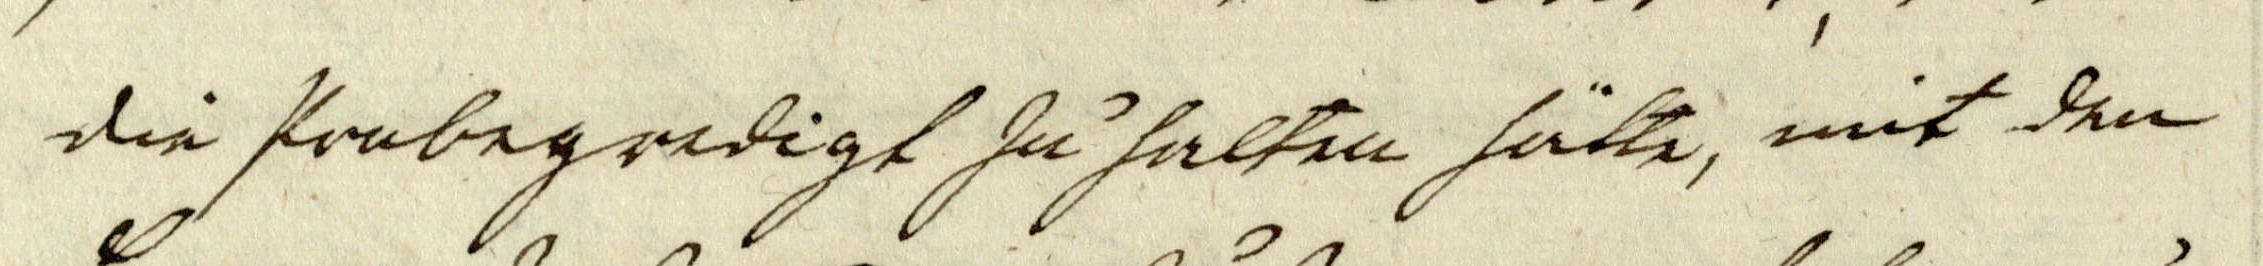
die Probepredigt zu halten hätte, mit den
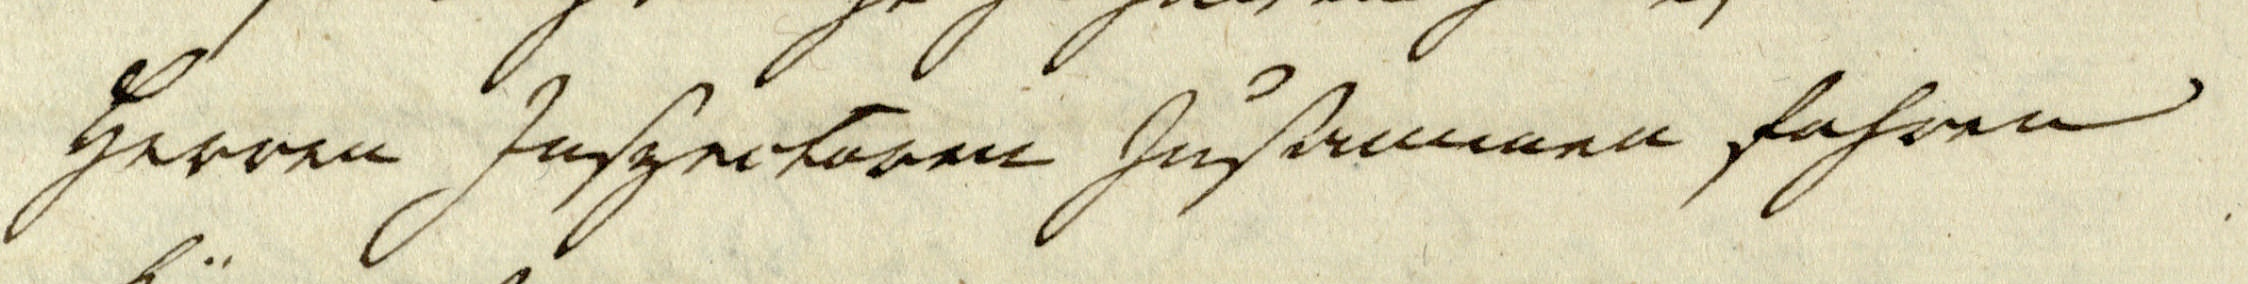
Herren Inspectoren zusammen fahren
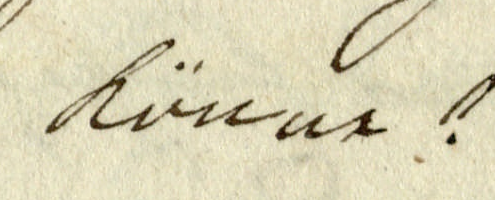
könne?
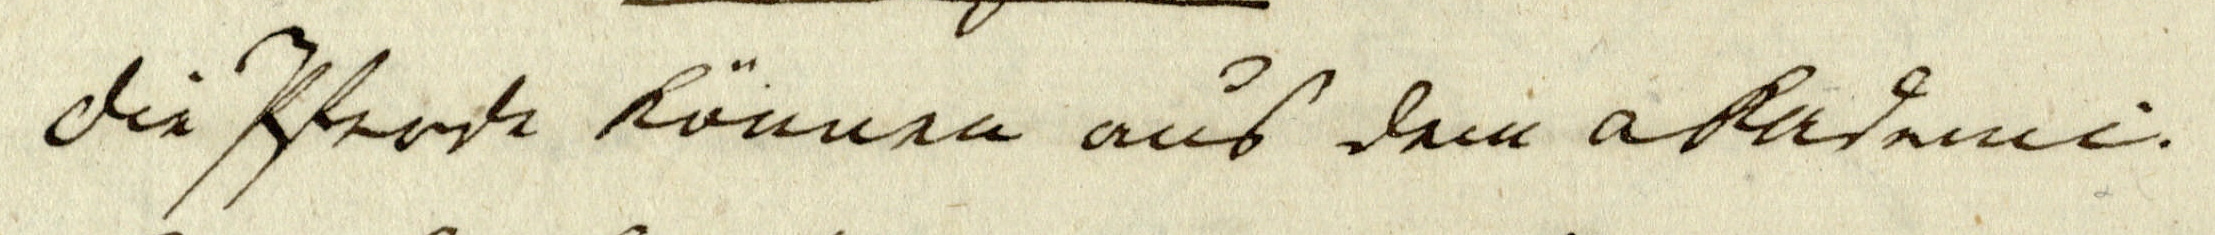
Die Pferde können aus dem akademi¬
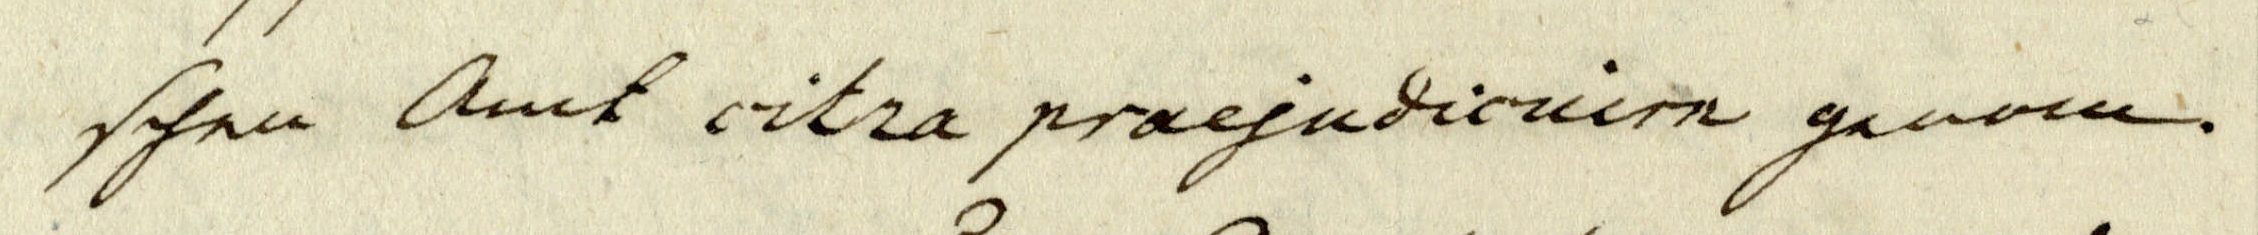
schen Amt citra praejudicium genom¬
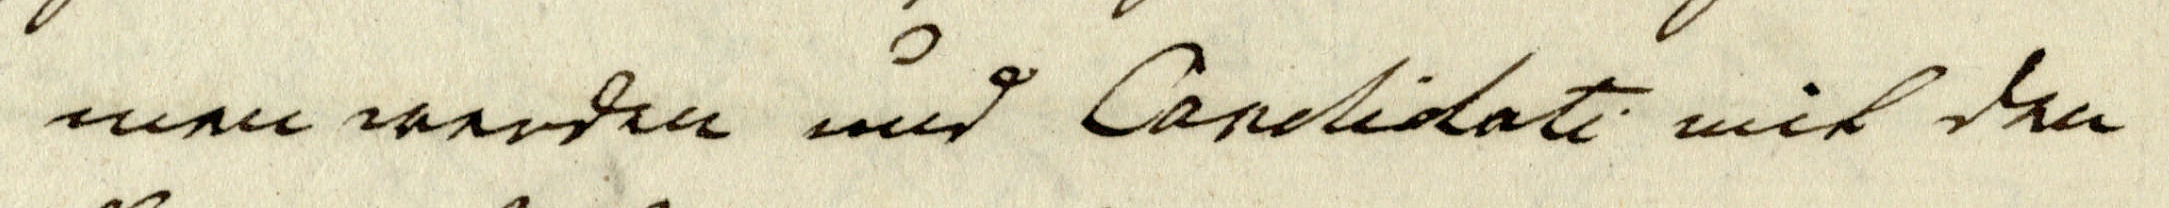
men werden und Candidati mit den
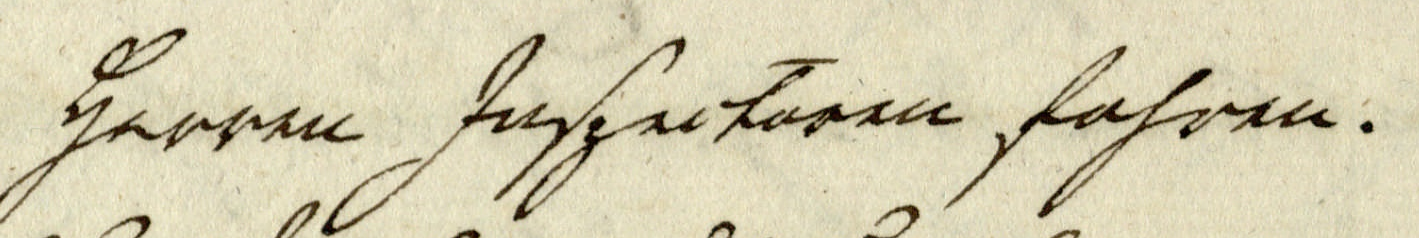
Herren Inspectoren fahren.
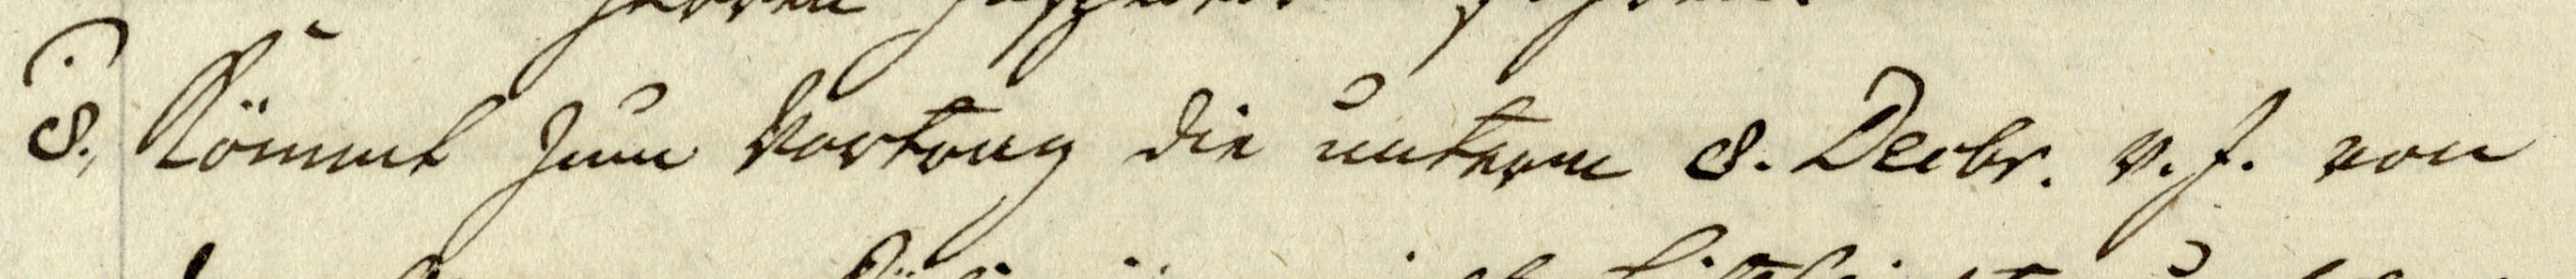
8. Kömmt zum Vortrag die unterm 8. Decbr. v. J. von
